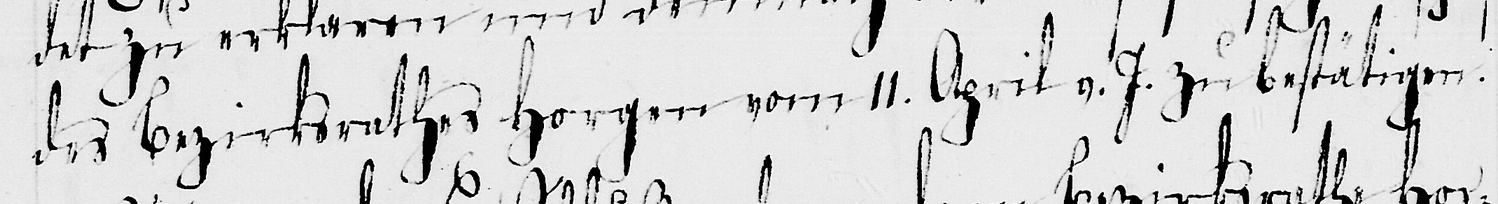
des Bezirksrathes Horgen vom 11. April v. J. zu bestätigen.
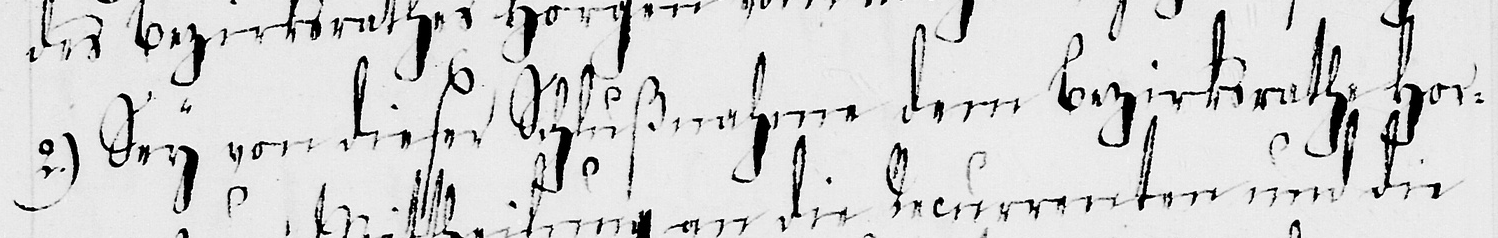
2.) Sey von dieser Schlußnahme dem Bezirksrathe Hor¬
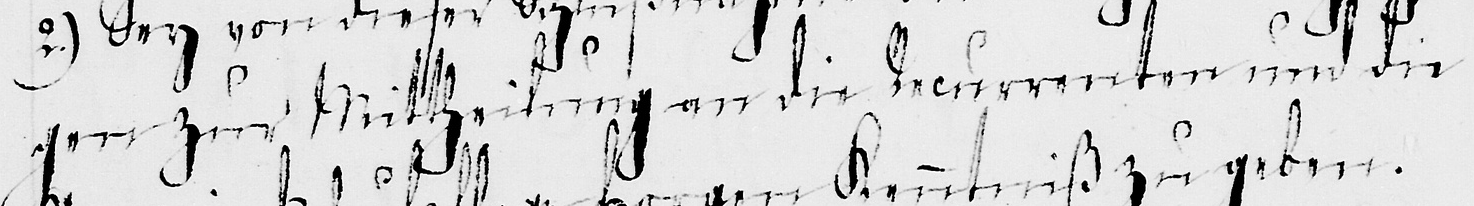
gen zur Mittheilung an die Recurrenten und die
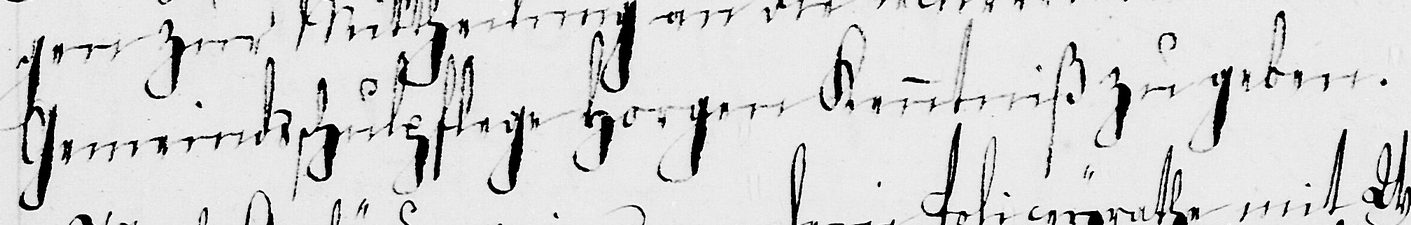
Gemeindsschulpflege Horgen Kenntniß zu geben.
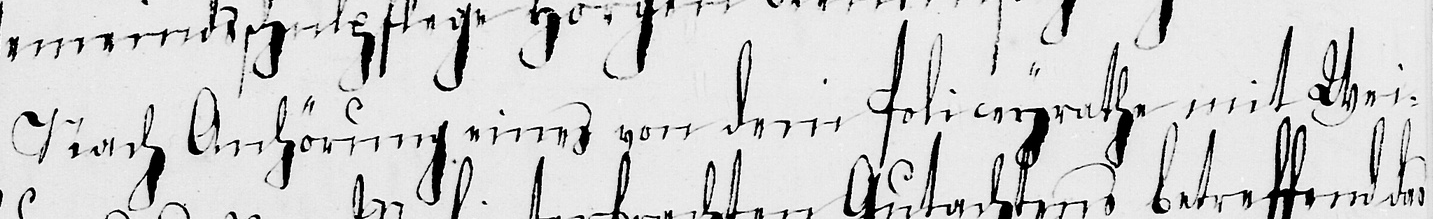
Nach Anhörung eines von dem Policeyrathe mit Wei¬
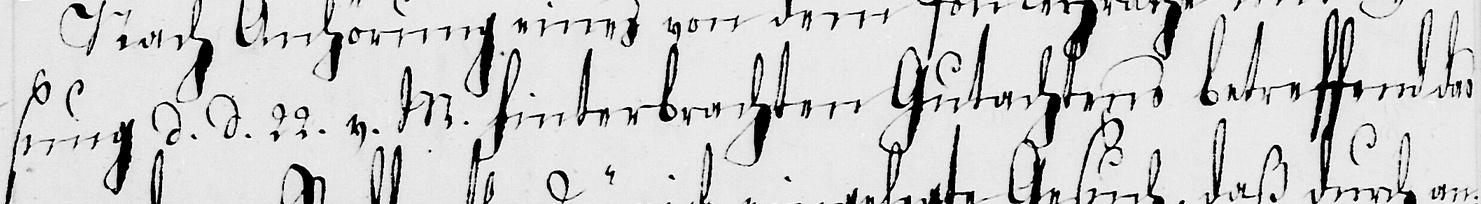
sung d. d. 22. v. M. hinterbrachten Gutachtens betreffend d¬
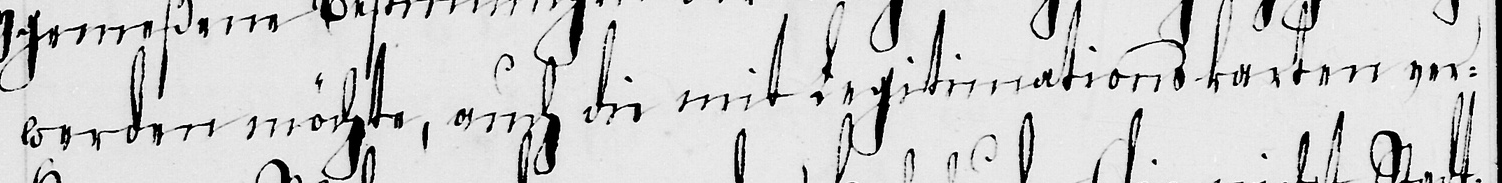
werden möchte, auch die mit Legitimationskarten ver¬
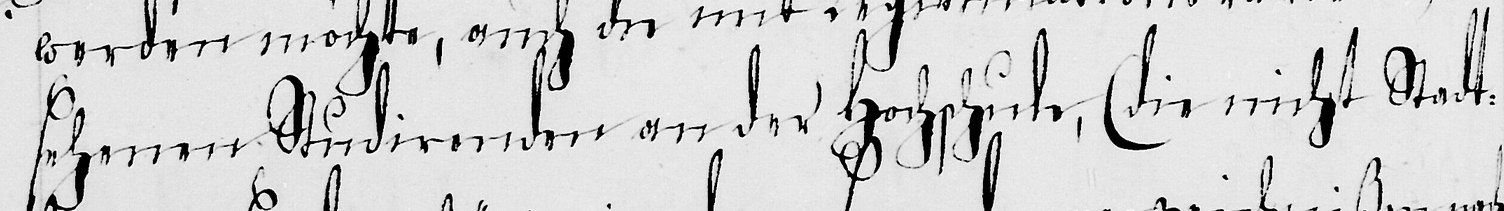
sehenen Studirenden an der Hochschule, (die nicht Stadt¬
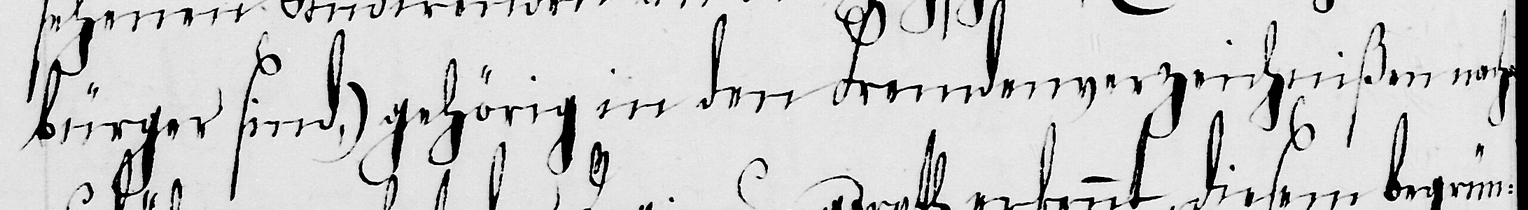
bürger sind,) gehörig in den Fremdenverzeichnißen nac¬
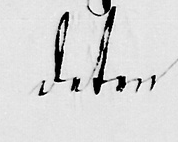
der
